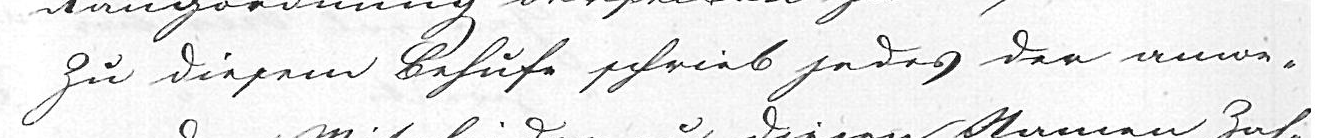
Zu diesem Behufe schrieb jedes der anwe-
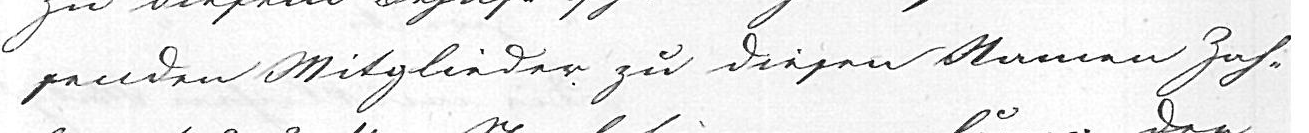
senden Mitglieder zu diesen Namen Zah-
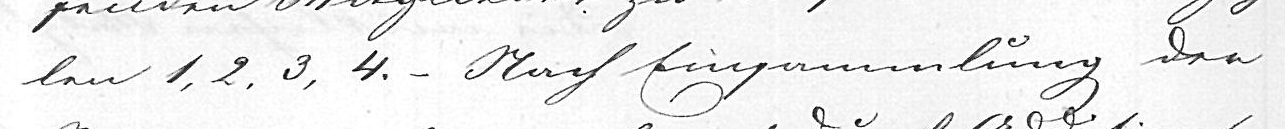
len 1, 2, 3, 4.- Nach Einsammlung der
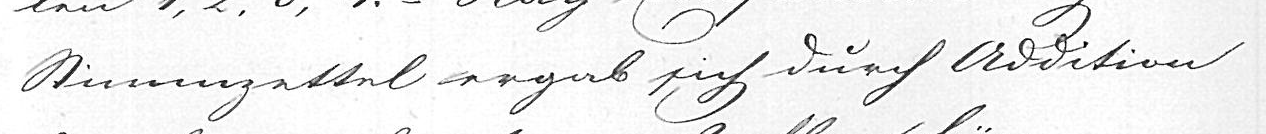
Stimmzettel ergab sich durch Addition
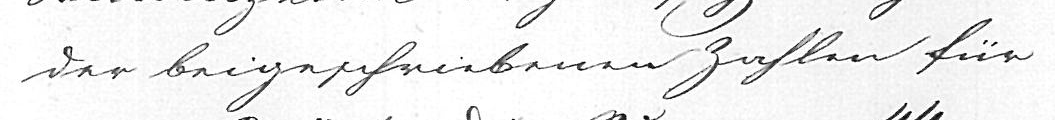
der beigeschriebenen Zahlen für
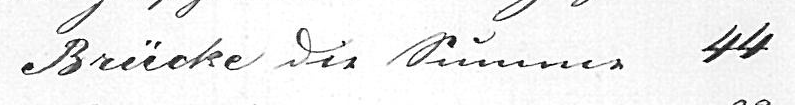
Brücke die Summe 44
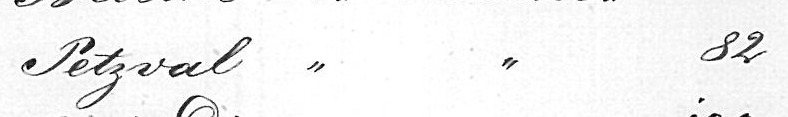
Petzval " " 82
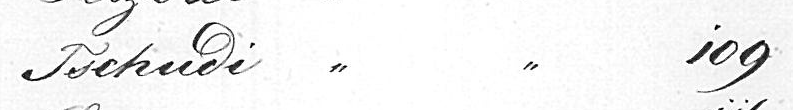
Tschudi " " 109
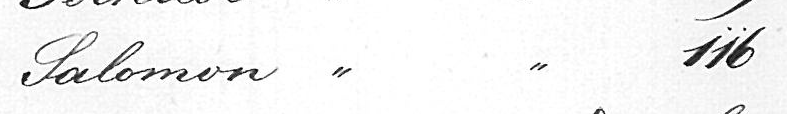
Salomon " " 116
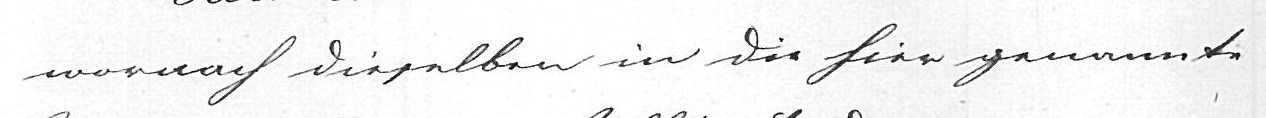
wornach dieselben in die hier genannte
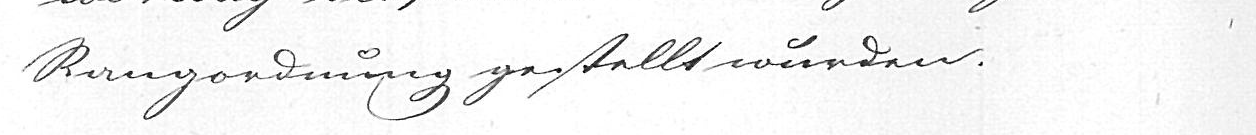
Rangordnung gestellt wurden.
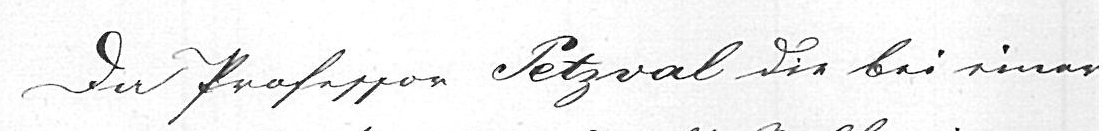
Das Professor Petzval die bei einer
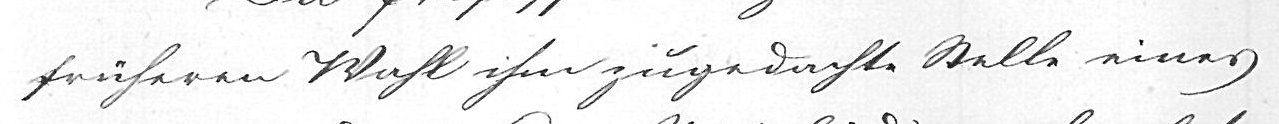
früheren Wahl ihm zugedacht Stelle eines
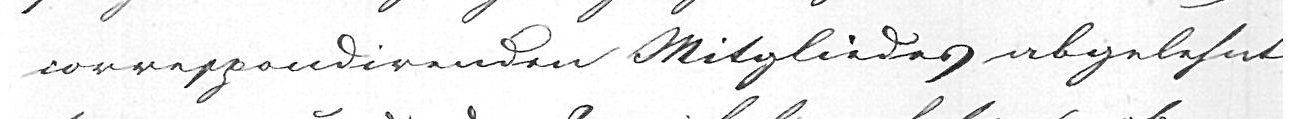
correspondirenden Mitgliedes abgelehnt
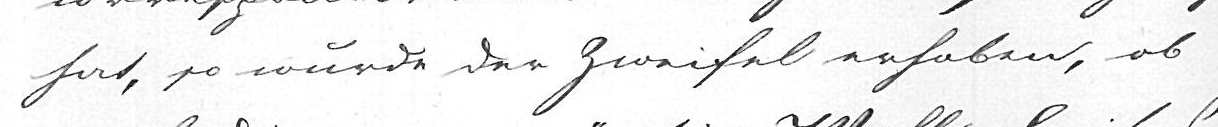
hat, so wurde der Zweifel erhoben, ob
